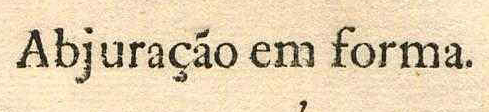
Abjuração em forma.
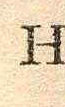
H
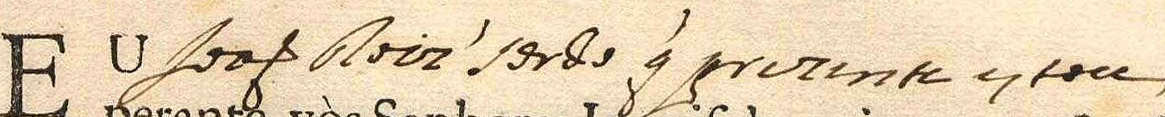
EU Joaõ Roiz̄ sordo q̄ prezente estou
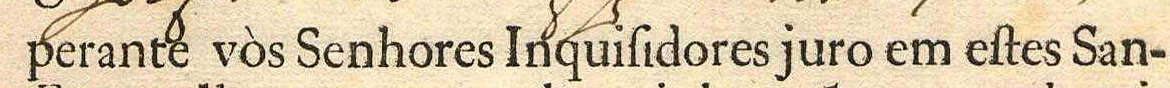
perante vòs Senhores Inquisidores juro em estes San
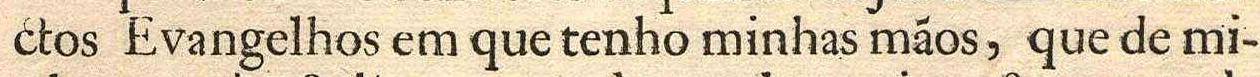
ctos Evangelhos em que tenho minhas mãos, que de mi
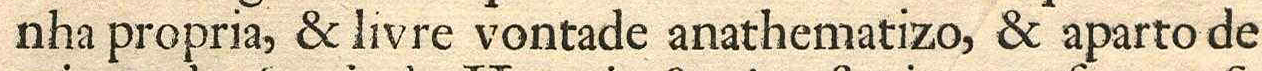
nha propria, & livre vontade anathematizo, & aparto de
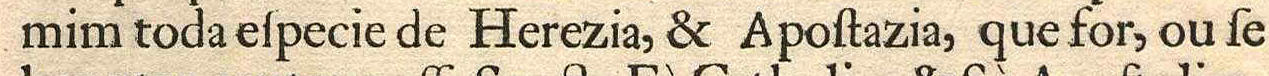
mim toda especie de Herezia, & Apostazia, que for, ou se
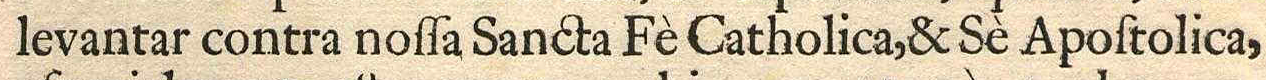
levantar contra nossa Sancta Fè Catholica, & Sè Apostolica,
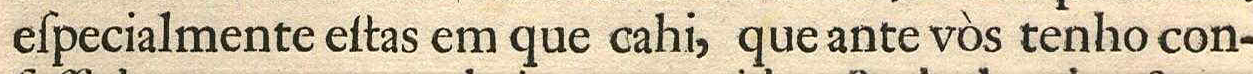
especialmente estas em que cahi, que ante vòs tenho con
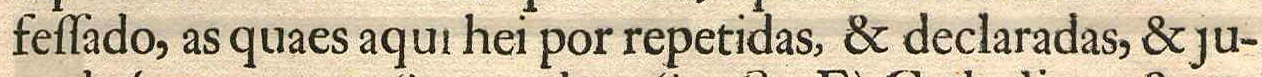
fessado, as quaes aqui hei por repetidas, & declaradas, & ju
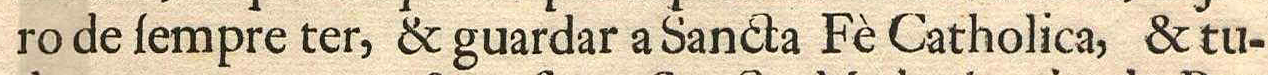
ro de sempre ter, & guardar a Sancta Fè Catholica, & tu
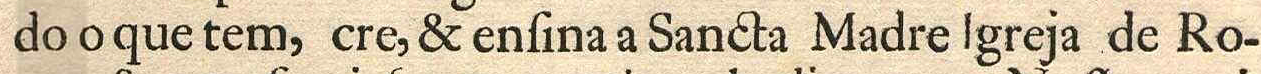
do o que tem, cre, & ensina a Sancta Madre Igreja de Ro
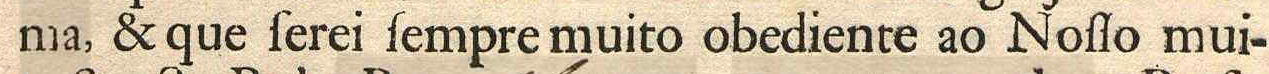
ma, & que serei sempre muito obediente ao Nosso mui
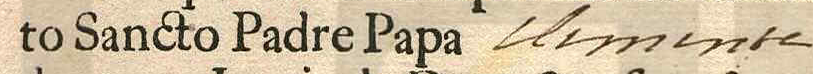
to Sancto Padre Papa Clemente
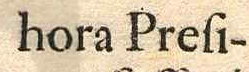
hora Presi
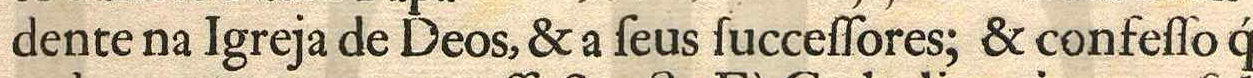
dente na Igreja de Deos, & a seus successores; & confesso q̄
